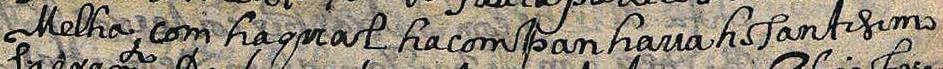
Melha com ha qual hacompanhaua ho santisimo
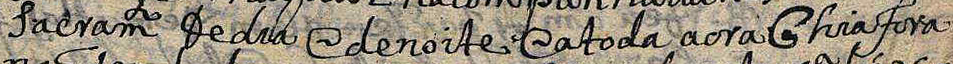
Sacramto De dia e de noite e a toda a ora q̄ hia fora
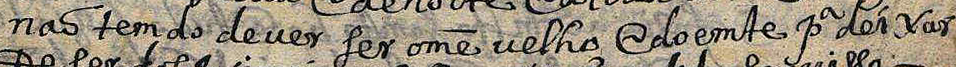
naõ temdo deuer ser omē uelho e doemte pa deixar
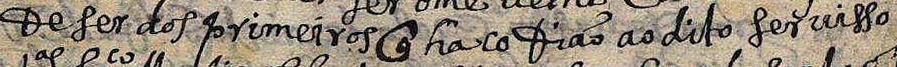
De ser dos primeiros q̄ hacoDião ao dito seruisso
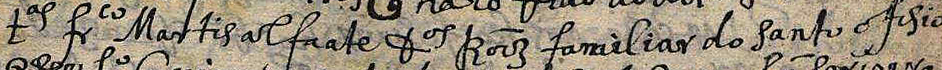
tas fr.co Martis alfaate Dos Rōiz familiar do Santo ofisio
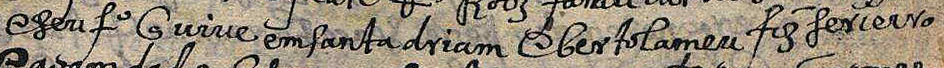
e seu fo q̄ uiue em santadriam e bertolameu frz serieiro
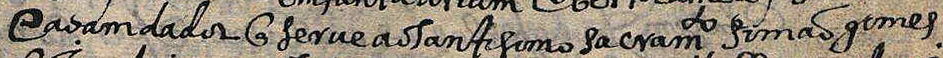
e ao amdador q̄ serue ao santisimo sacramto simaõ gomes
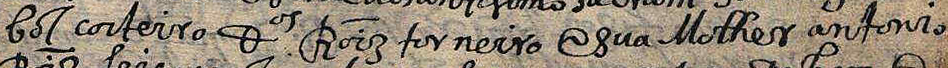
bol coiteiro Dos Roīz torneiro e sua Molher antonio
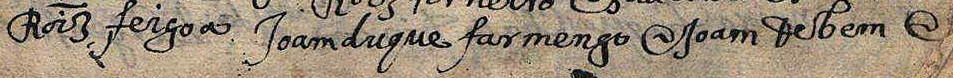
Roīz feigoa Joam duque farmengo e Joam De bem e
